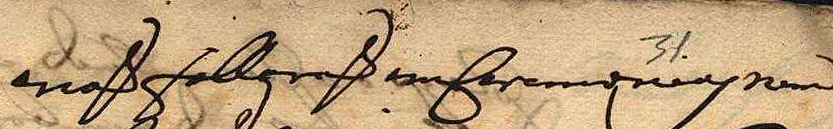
e naõ fallaraõ em Ceremonias nem
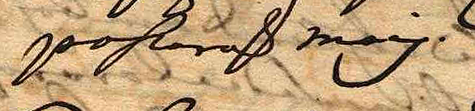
passaraõ mais.
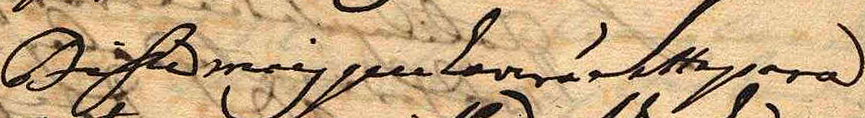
Disse mais que havera Sette para
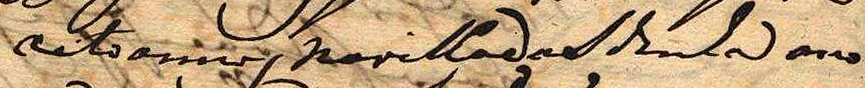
oito annos na villa da Idanha, a no
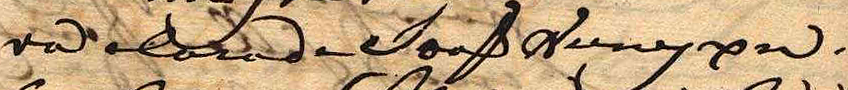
va e Caza de Ioaõ Nunes xn.
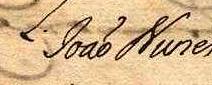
L. Ioão Nunes
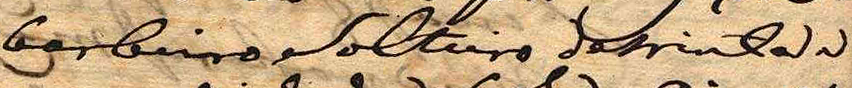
barbeiro, Solteiro de trinta a
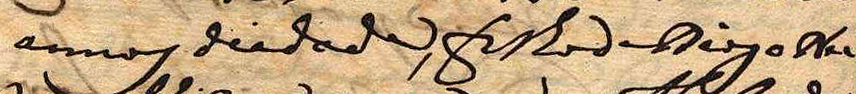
annos de idade, filho de Diogo Nu
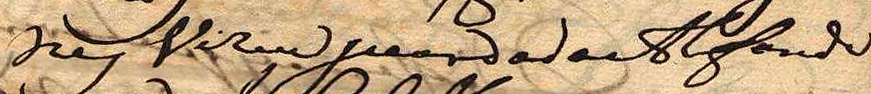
nes Vizeu guarda da Alfande
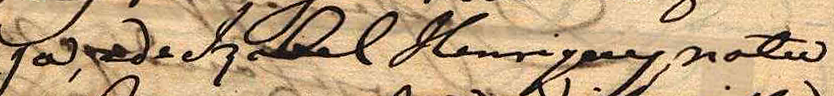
ga, e de Izabel Henriques, natu
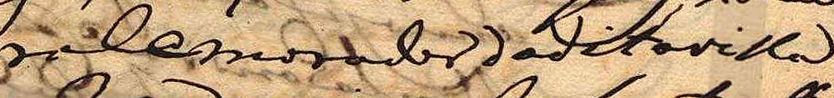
ral e morador da dita villa
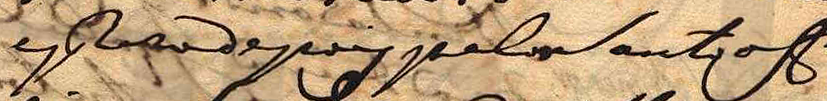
e pRezo depois pelo Santo offi
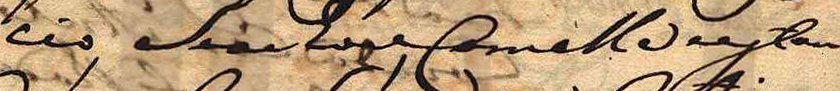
cio se achou Com elle, e estan
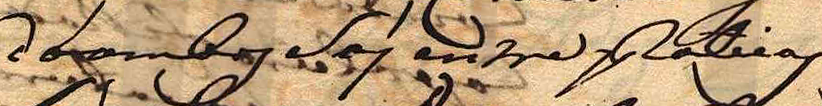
do ambos Sos entre pRaticas
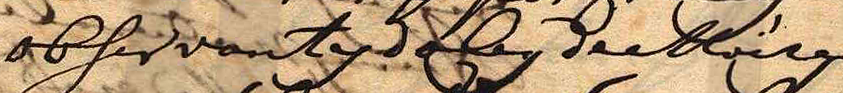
observantes da Ley de Moizes
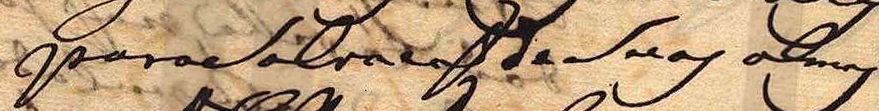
para salvaçaõ de Suas almas
